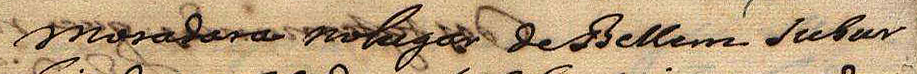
moradora no lugar de Bellem subur
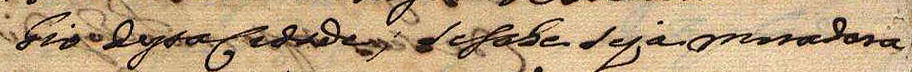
bio desta Cidade, se sabe seja moradora
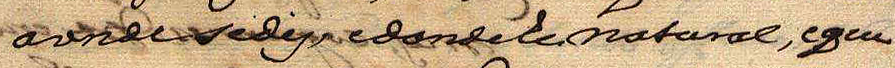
aonde se dis, e donde he natural, e que
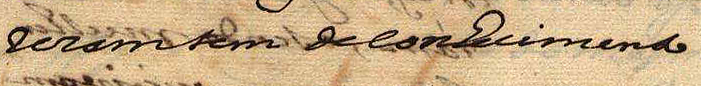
rezam tem de conhecimento
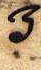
3
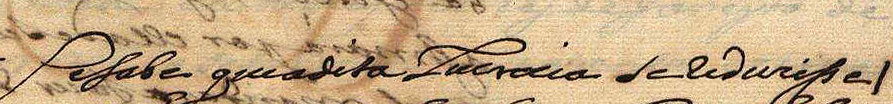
Se sabe que a dita Lucrecia se Reduzisse/
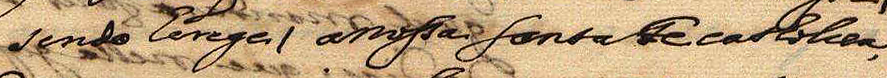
sendo herege/ a nossa santa Fe catholica,
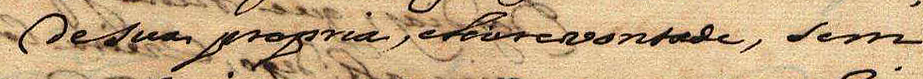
de sua propria, e livre vontade, sem
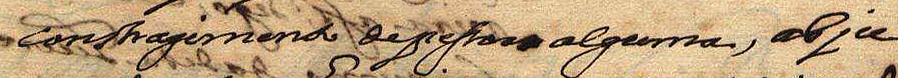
constragimento de pessoa alguma, abju
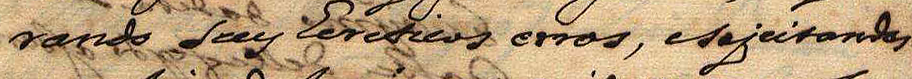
rando seus hereticos erros, e sojeitando
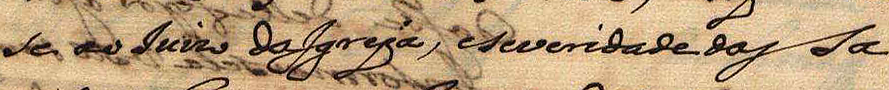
se ao Iuizo da Jgreja, e severidade dos Sa
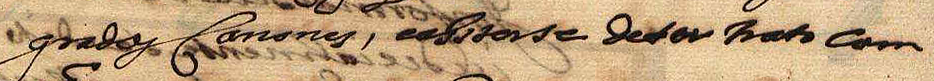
grados Canones, e absterse de ter trato com
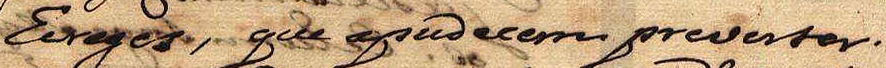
hereges, que a pudecem preverter.
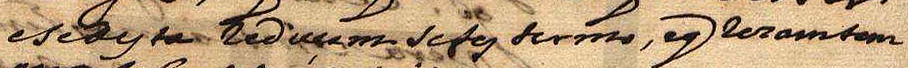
e se desta Reduçam se fes termo, e q̄ Rezam tem
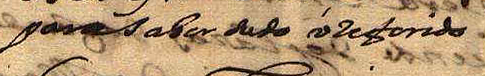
para saber tudo o referido
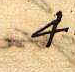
4
